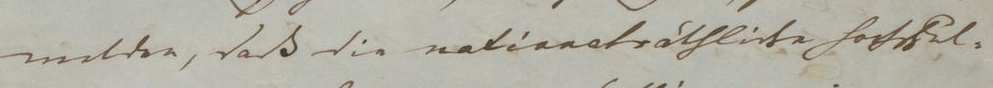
melden, daß die nationalräthliche Hochschul-
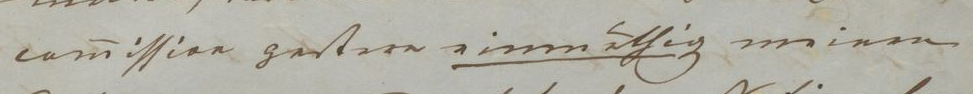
commission gesterneinmüthig meinen
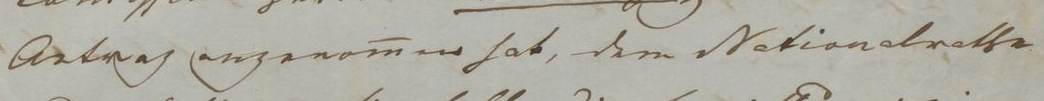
Antrag angenommen hat, dem Nationalrathe
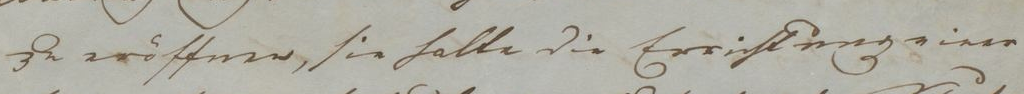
zu eröffnen, sie halte die Errichtung einer
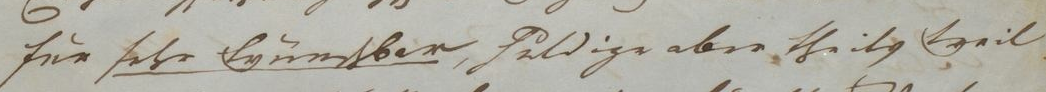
für sehr wünschbar, huldige aber theils weil
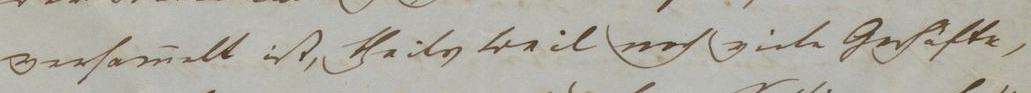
versammelt ist, theils weil noch viele Geschäfte,
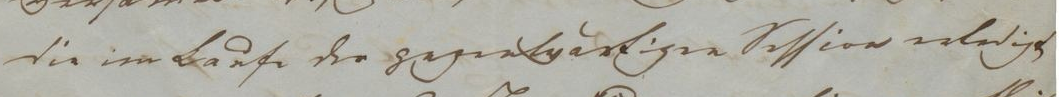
die im Laufe der gegenwärtigen Session erledigt
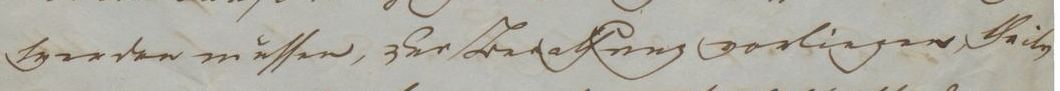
werden müssen, zur Berathung vorliegen, theils
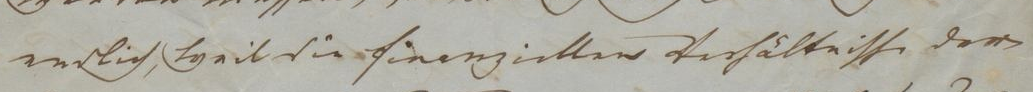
endlich, weil die finanziellen Verhältnisse der
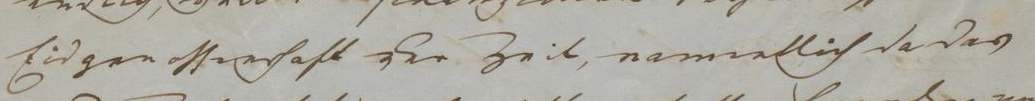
Eidgenossenschaft zur Zeit, namentlich da das
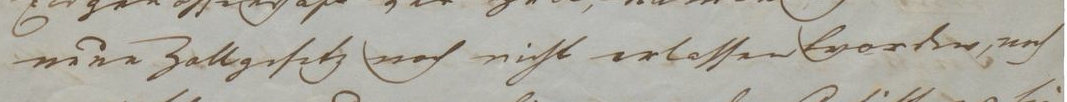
neue Zollgesetz noch nicht erlassen worden, noch
